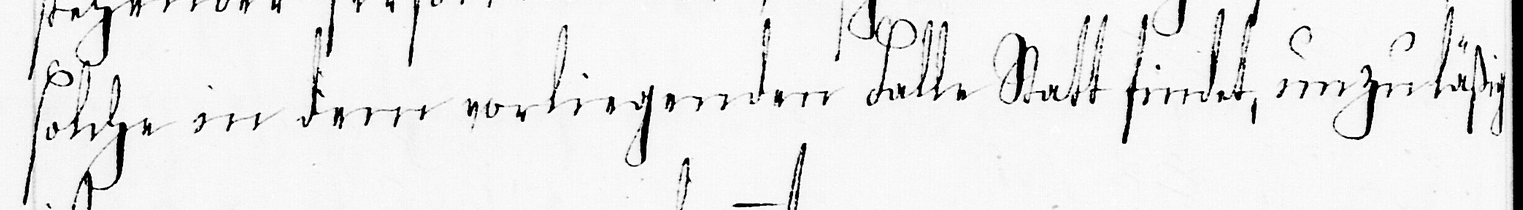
solche in dem vorliegenden Falle Statt findet, unzuläßig
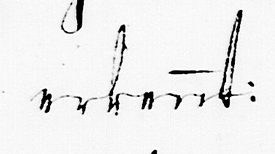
erkennt:
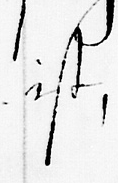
ist,
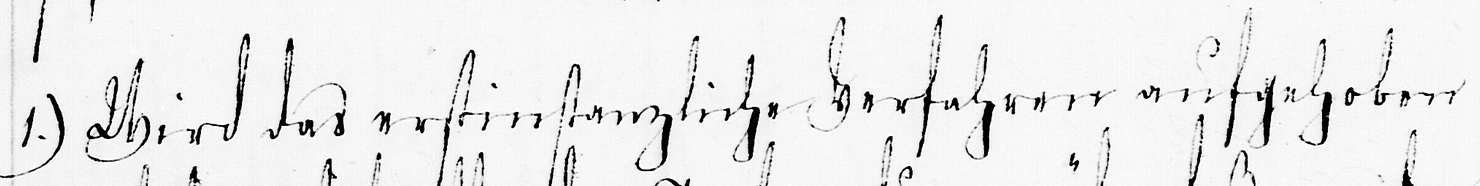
1.) Wird das erstinstanzliche Verfahren aufgehoben
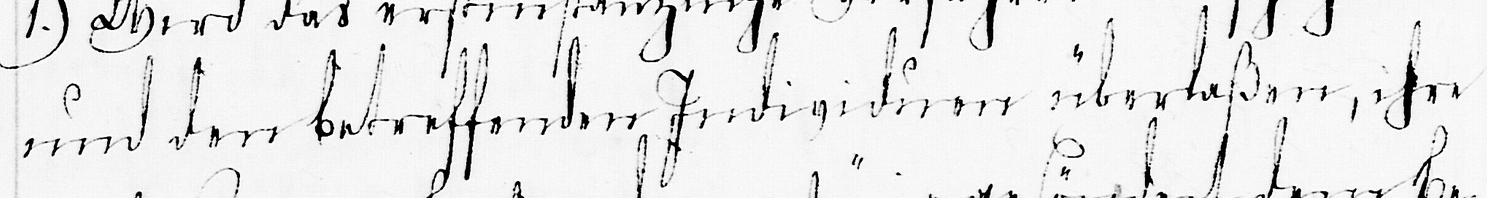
und den betreffenden Individuen überlaßen, ihre
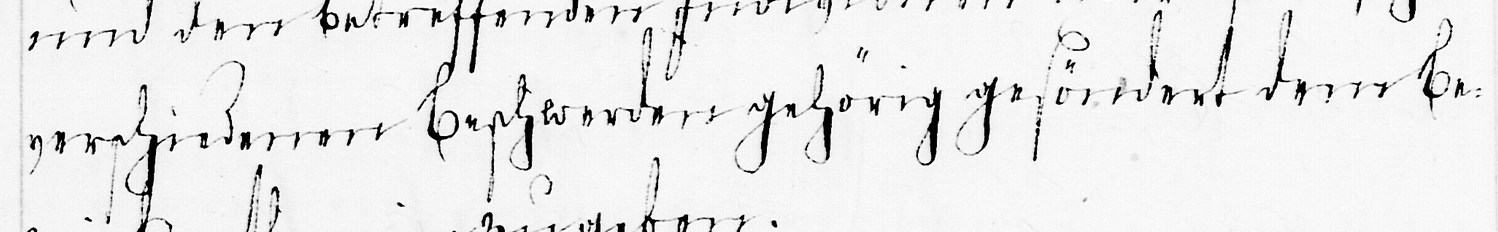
verschiedenen Beschwerden gehörig gesöndert dem Be¬
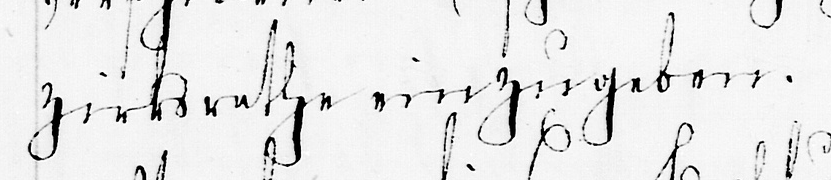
zirksrathe einzugeben.
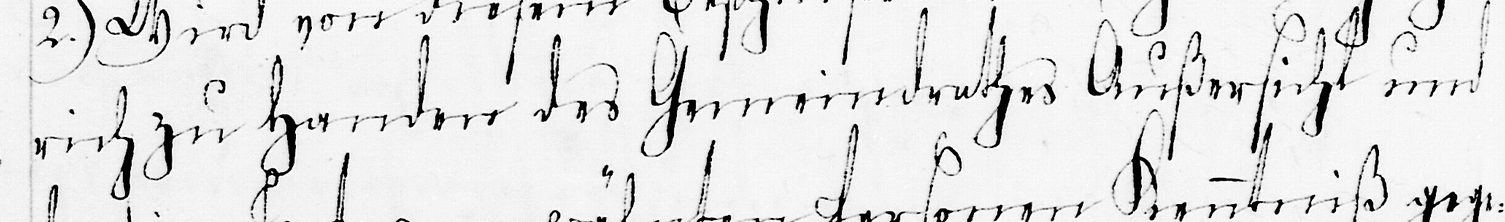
rich zu Handen des Gemeindrathes Außersihl und
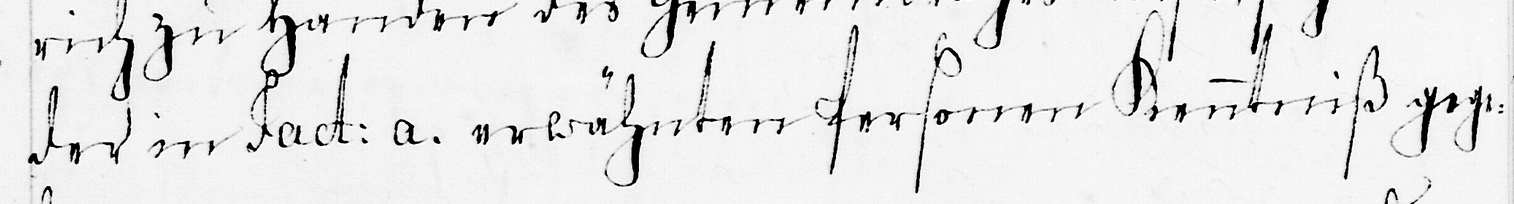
der in Fact: a. erwähnten Personen Kenntniß gege¬
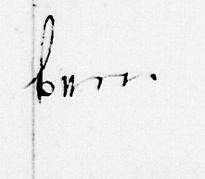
ben.
